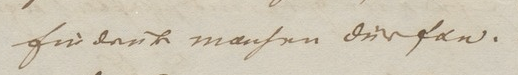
Eindruk machen dürfte. –
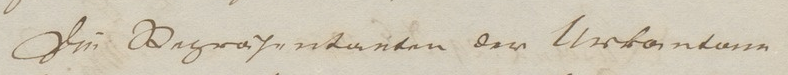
Die Repräsentanten der Urkantone
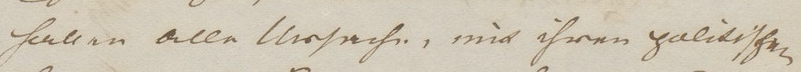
haben alle Ursache, mit ihren politischen
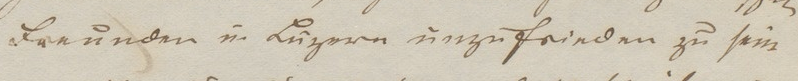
Freunden in Luzern unzufrieden zu sein
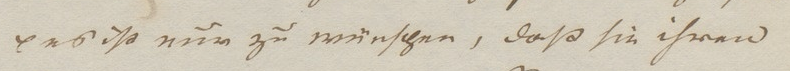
& es ist nur zu wünschen, daß sie ihren
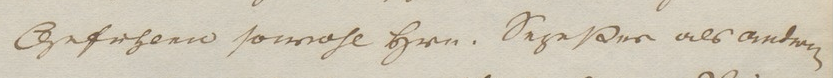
Gefühlen sowohl Hrn. Segeßer als andern
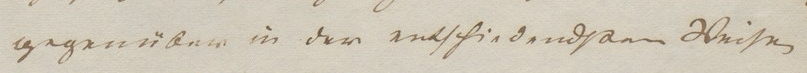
gegenüber in der entschiedendsten Weise
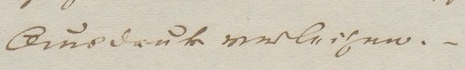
Ausdruk verleihen. –
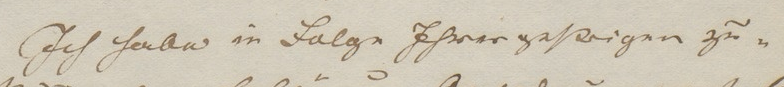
Ich habe in Folge Ihrer gestrigen zu-
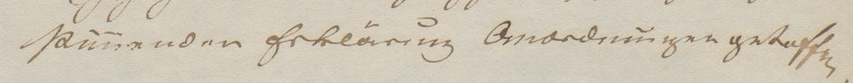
stimmenden Erklärung Anordnungen getroffen,
